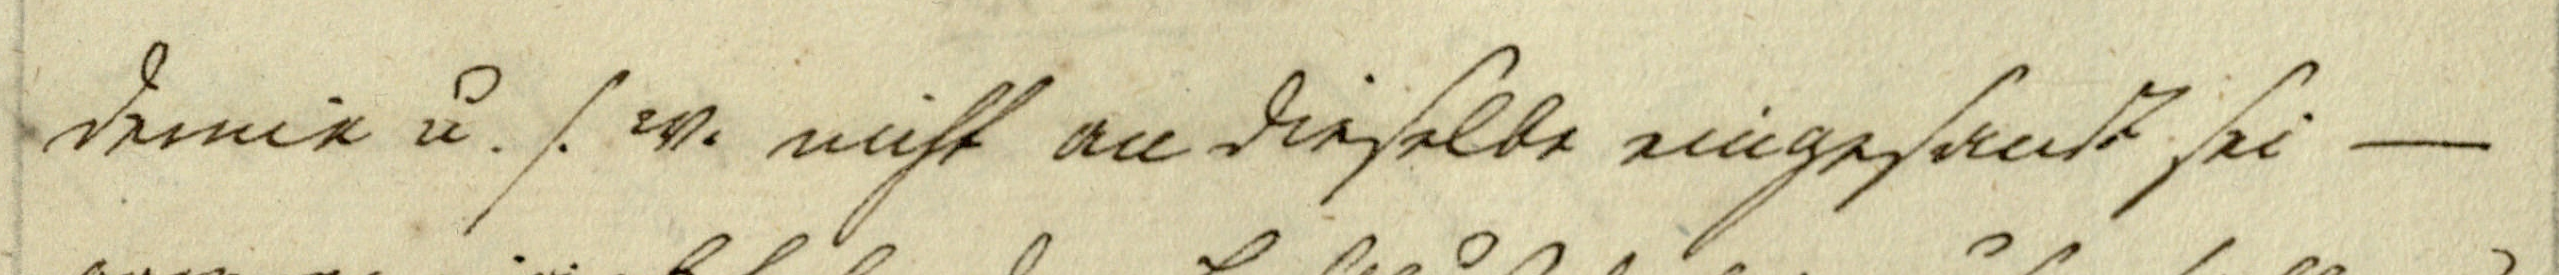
demie u. s. w. nicht an dieselbe eingesandt sei
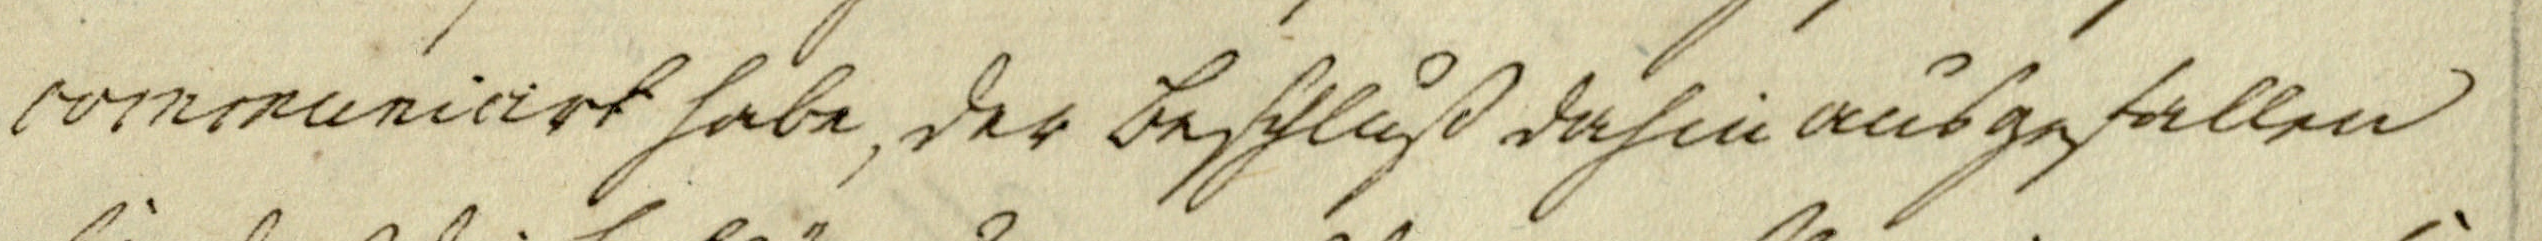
communicirt habe, der Beschluß dahin ausgefallen
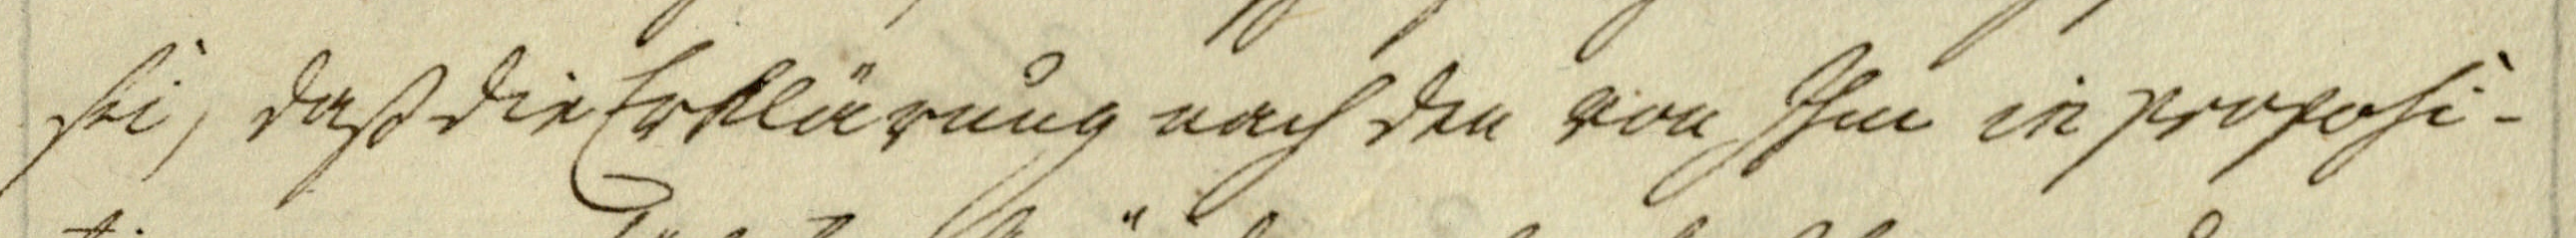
sei, daß die Erklärung nach den von Ihm in proposi¬
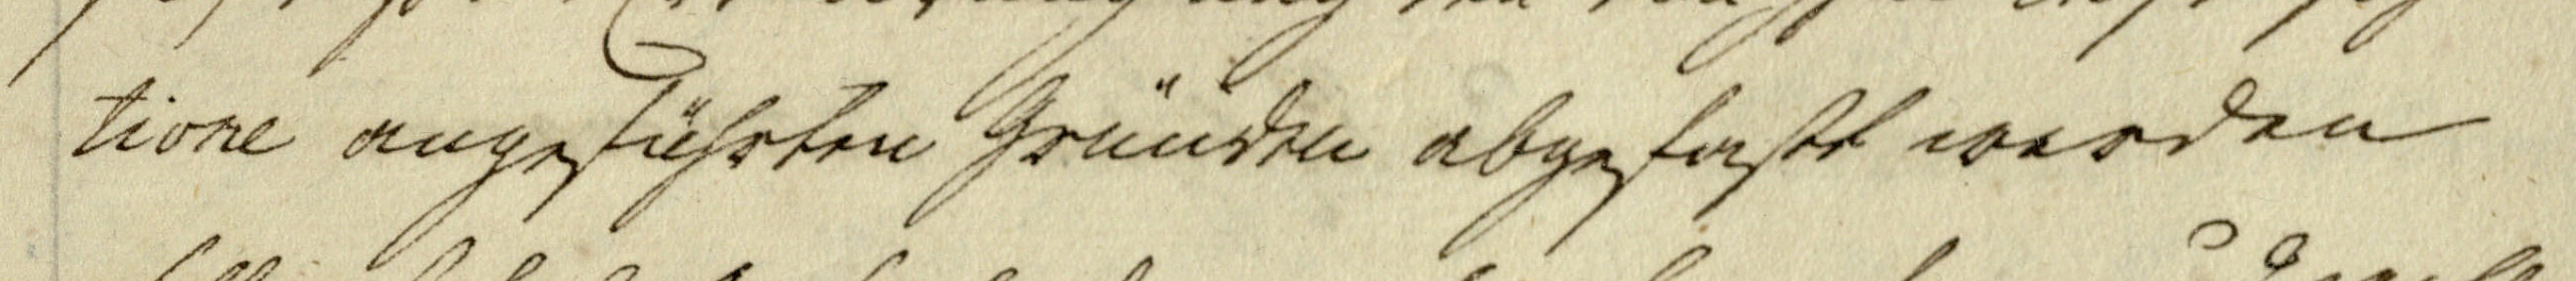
tione angeführten Gründen abgefaßt werden
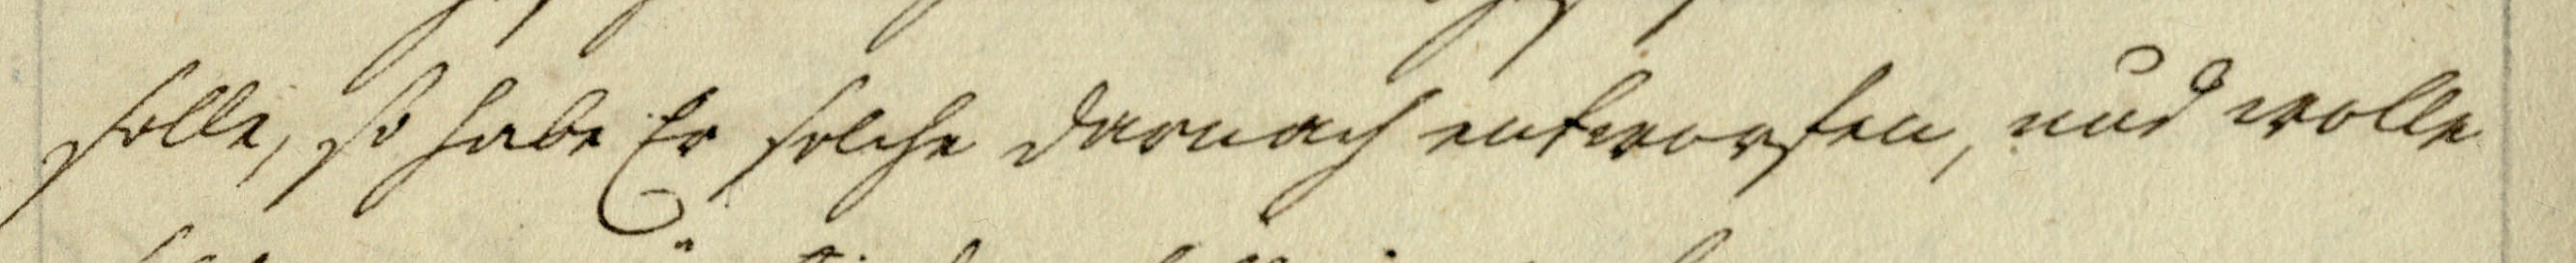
solle, so habe Er solche darnach entworfen, und wolle
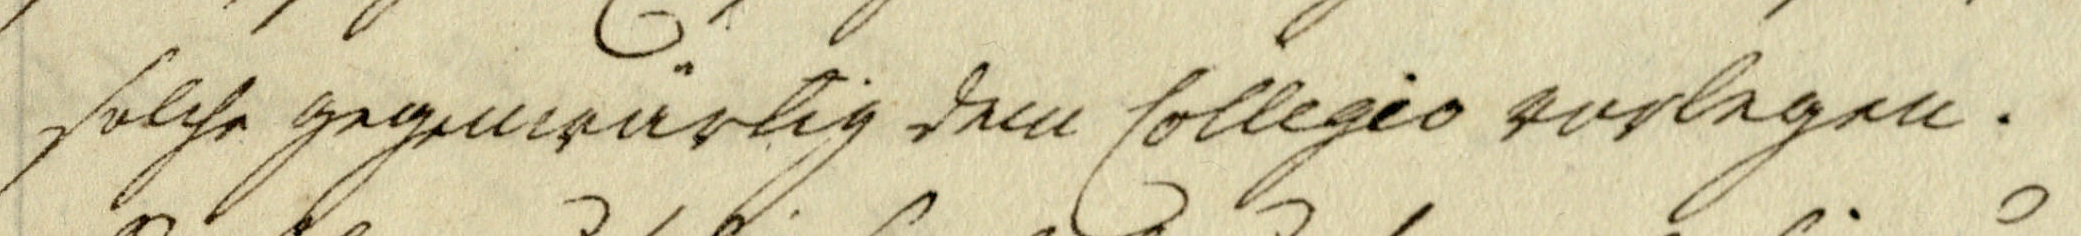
solche gegenwärtig dem Collegio vorlegen.
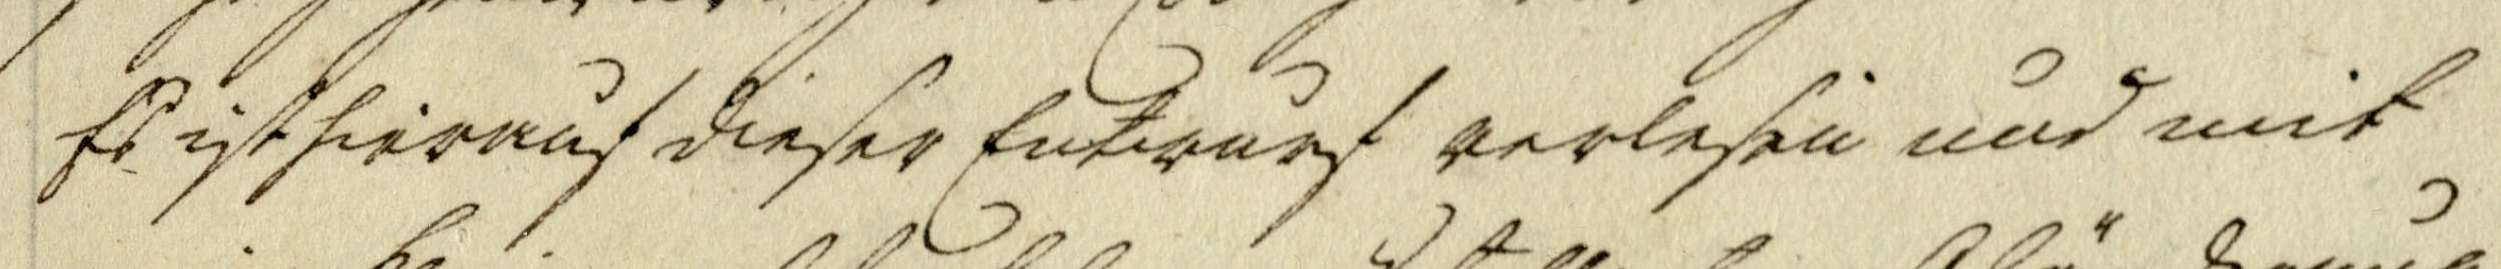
Es ist hierauf dieser Entwurf verlesen und mit
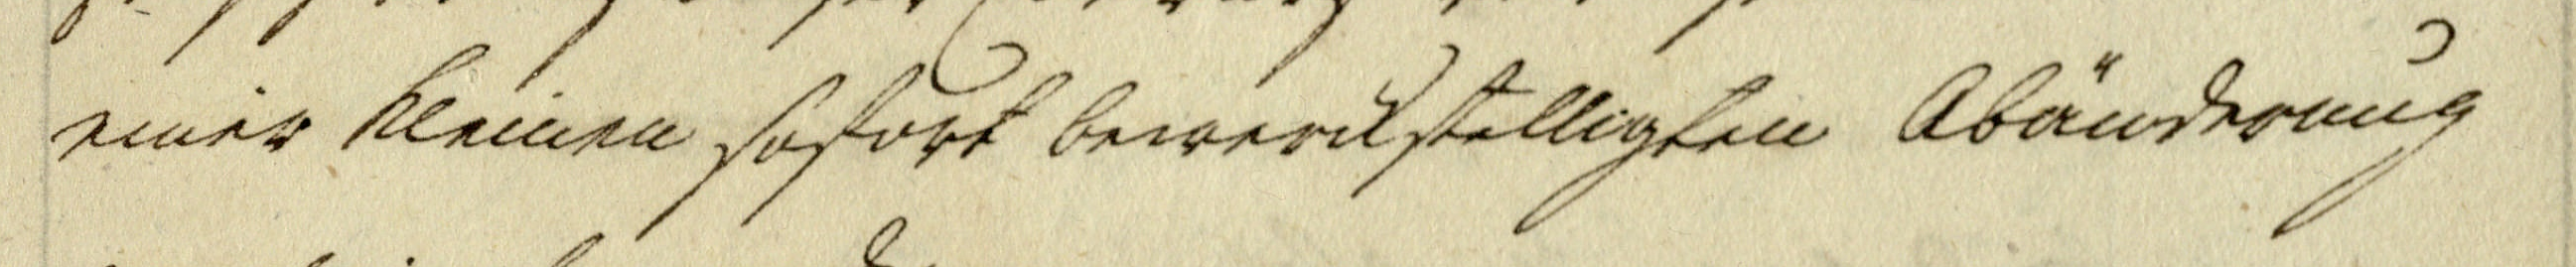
einer kleinen sofort bewerckstelligten Abänderung
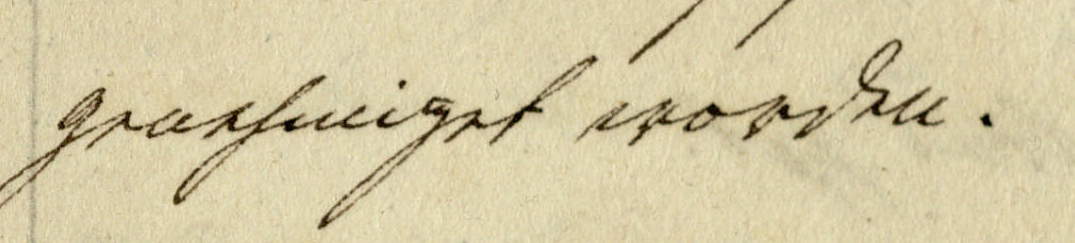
genehmiget worden.
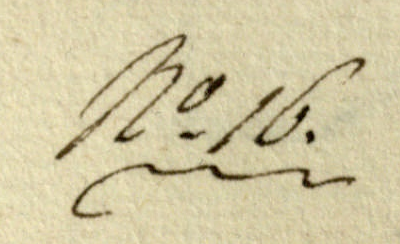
No 16.
